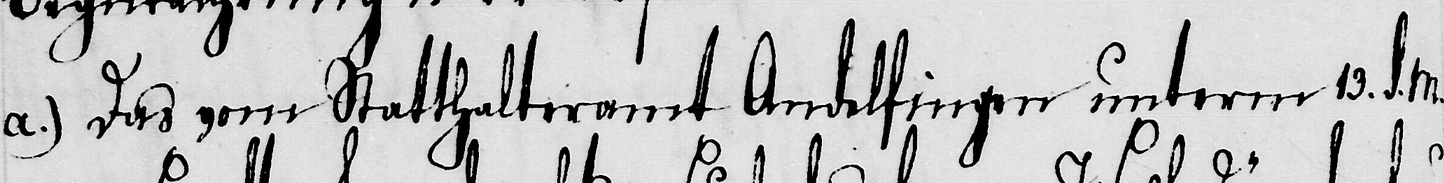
a.) Das vom Statthalteramt Andelfingen unterm 13. d.
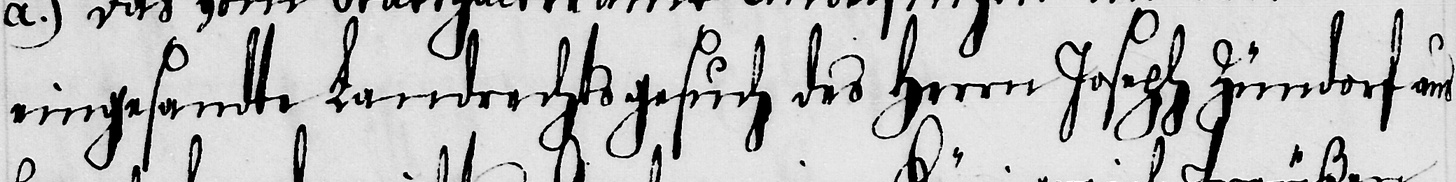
eingesandte Landrechtsgesuch des Herrn Joseph Zündorf a¬
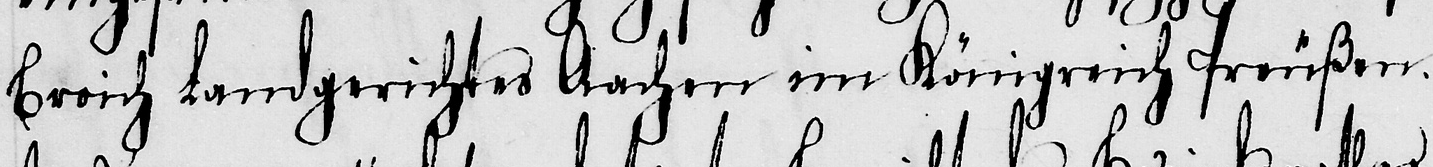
Broich Landesgerichtes Aachen im Königreich Preußen.
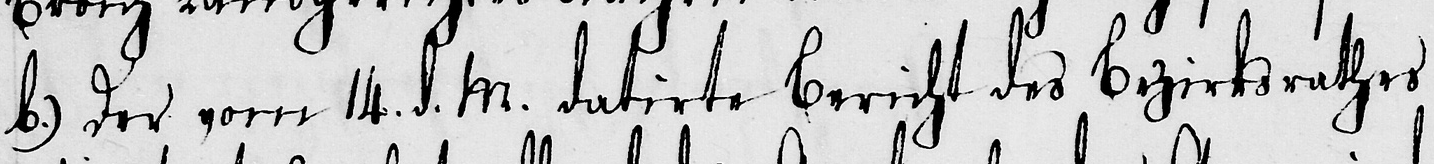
b.) Der vom 14. d. M. datirte Bericht des Bezirksrathes
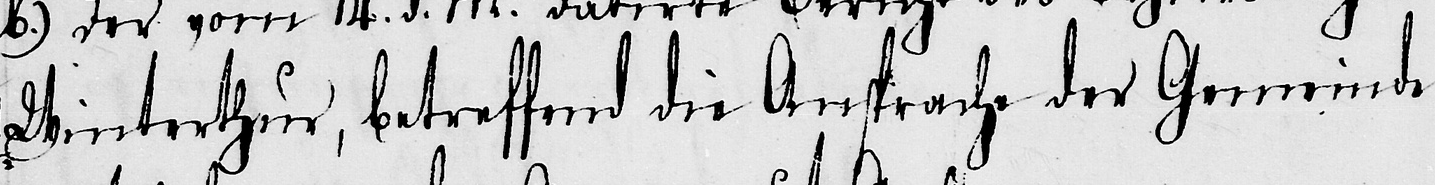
Winterhtur, betreffend die Ansprache der Gemeinde
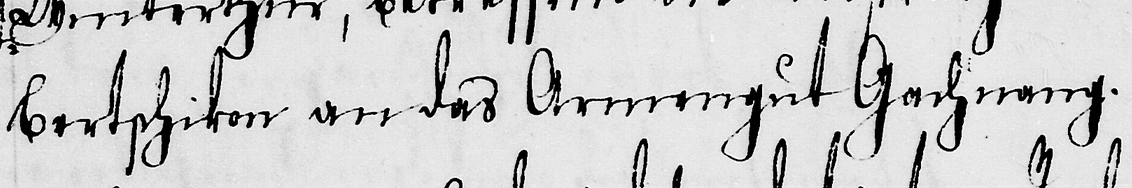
Bertschikon an das Armengut Gachnang.
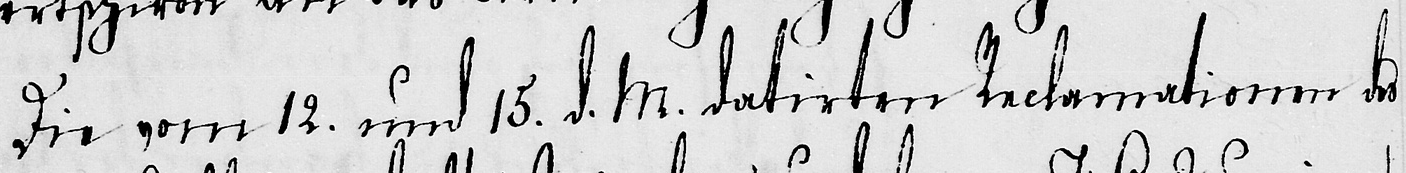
Die vom 12. und 15. d. M. datirten Reclamationen des
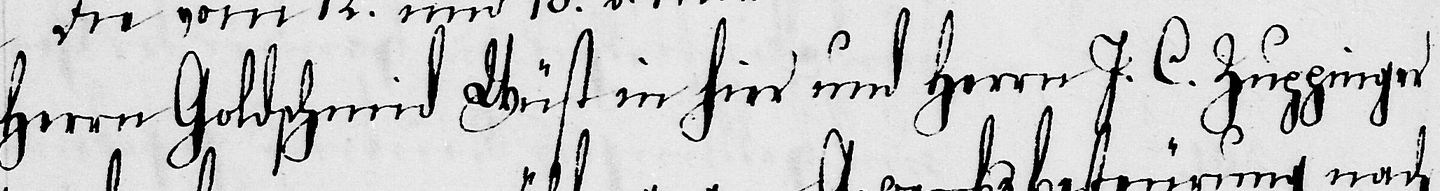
Herrn Goldschmid Wüst in hier und Herrn J. C. Zuppinger
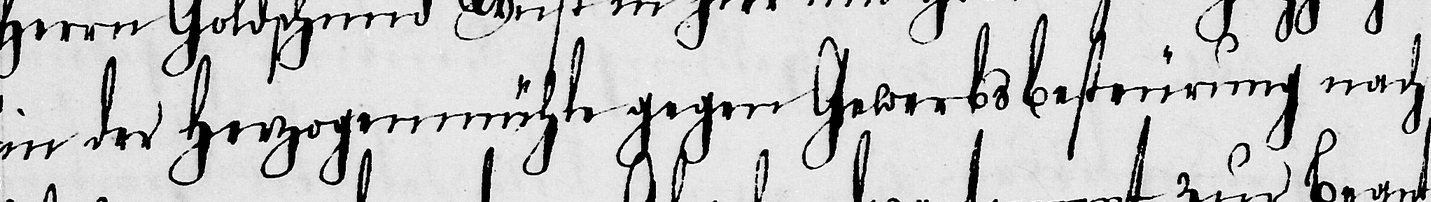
in der Herzogenmühle gegen Gewerbsbesteuerung nach
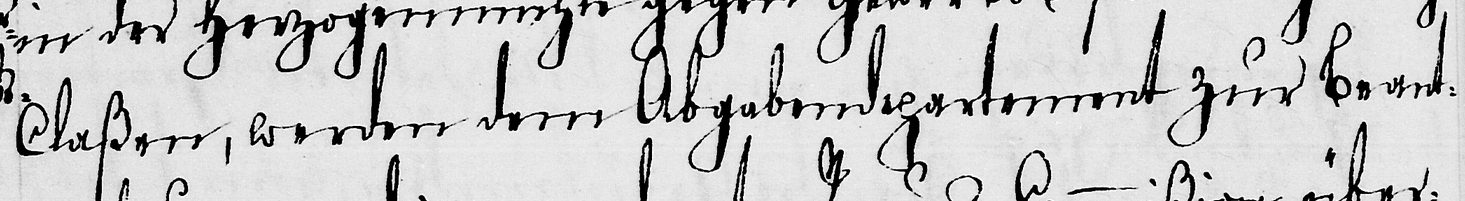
Claßen, werden dem Abgabendepartement zur Beant¬
